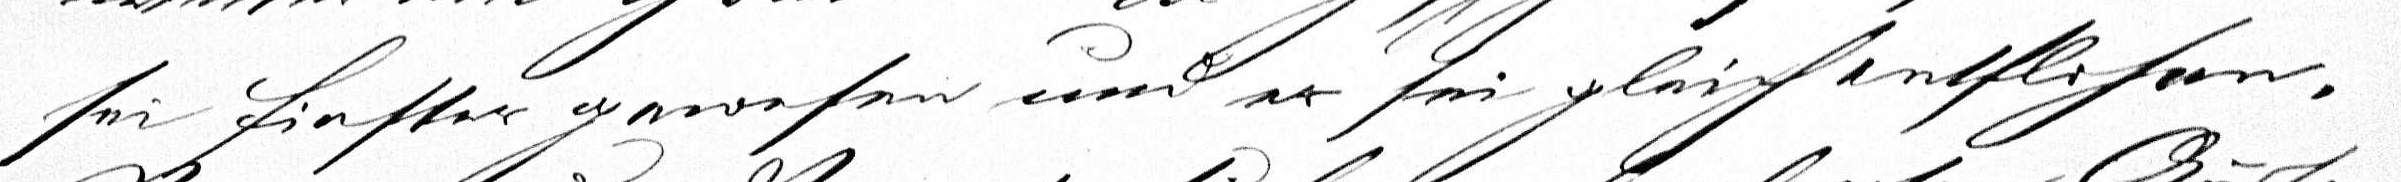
sei finster gewesen und er sei gleich entflohen.
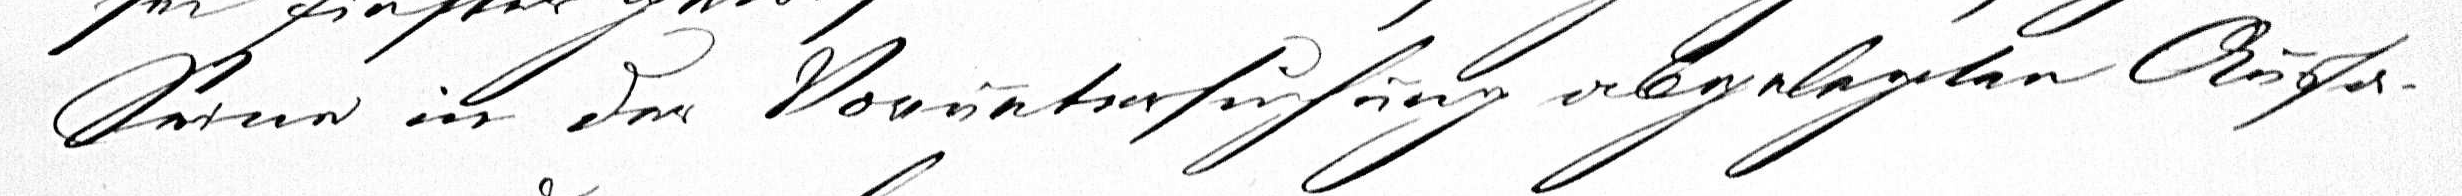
Seine in der Voruntersuchung abgelegten Aussa¬
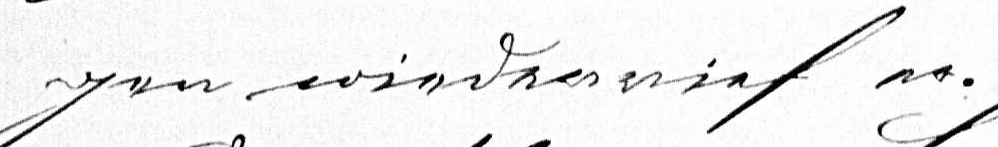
gen wiederrieft er.
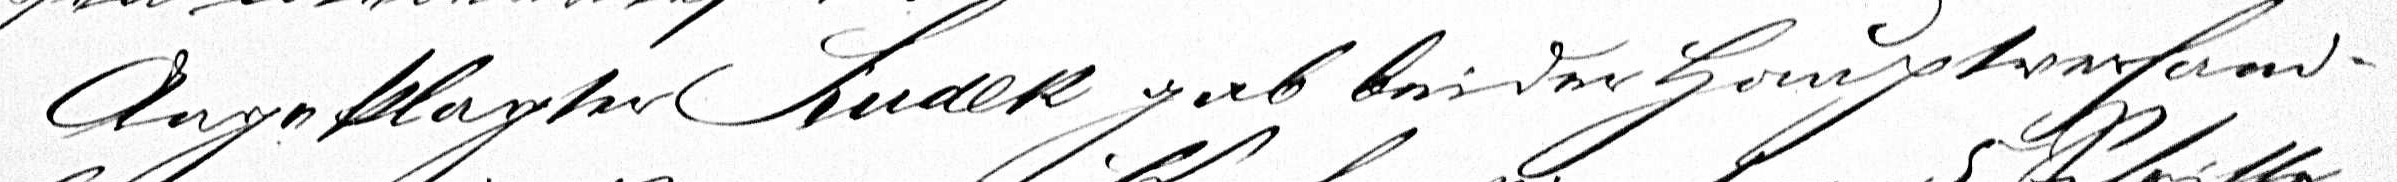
Angeklagter Sindek gab bei der Hauptverhand¬
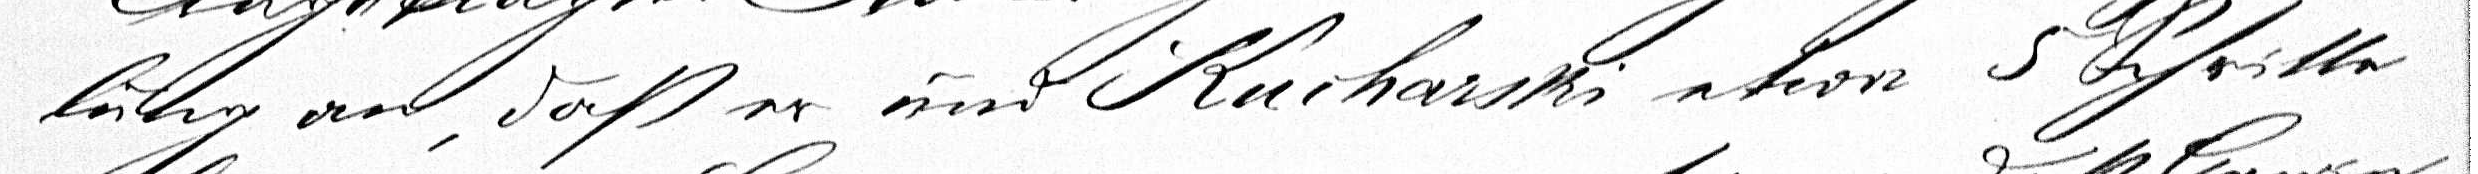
lung an, daß er und Kucharski etwa 5 Schritte
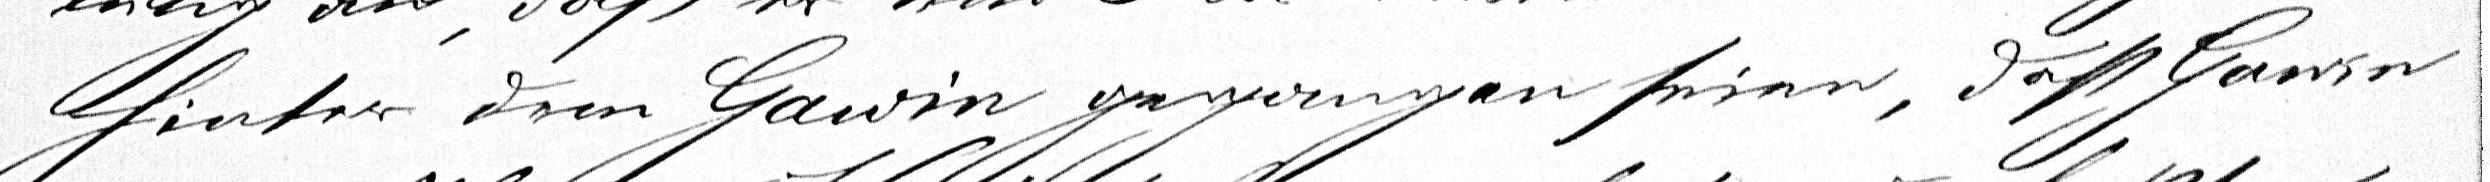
hinter dem Gawin gegangen seien, daß Gawin
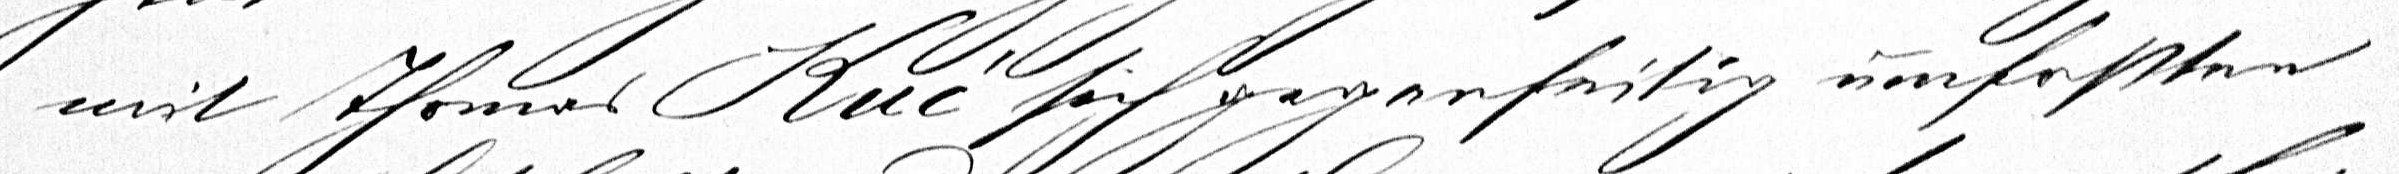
mit Thomas Kuć sich gegenseitig umfaßten
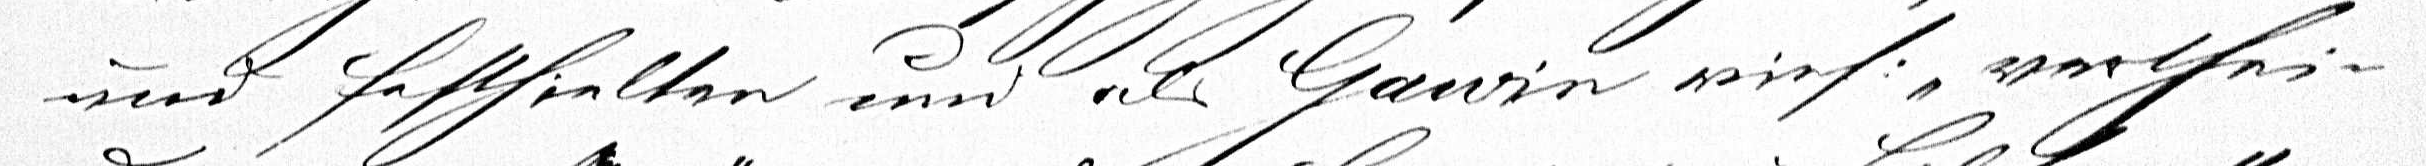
und festhielten und als Gawin rief „verthei¬
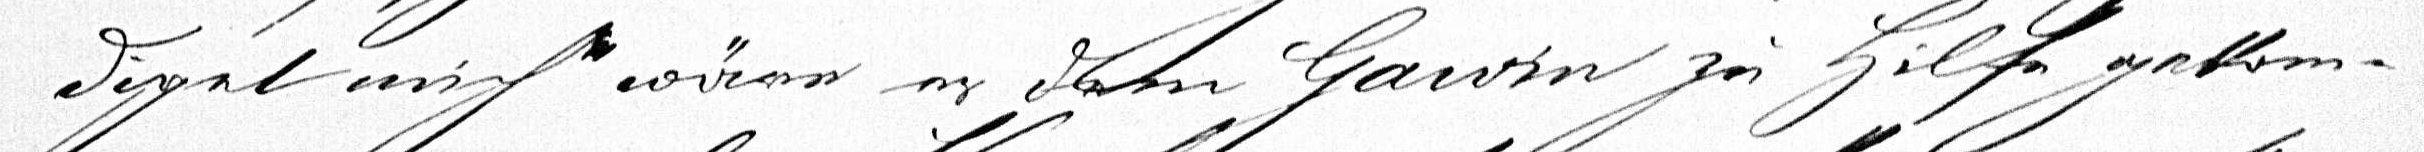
diget mich“ wäre er dem Gawin zu Hilfe gekom¬
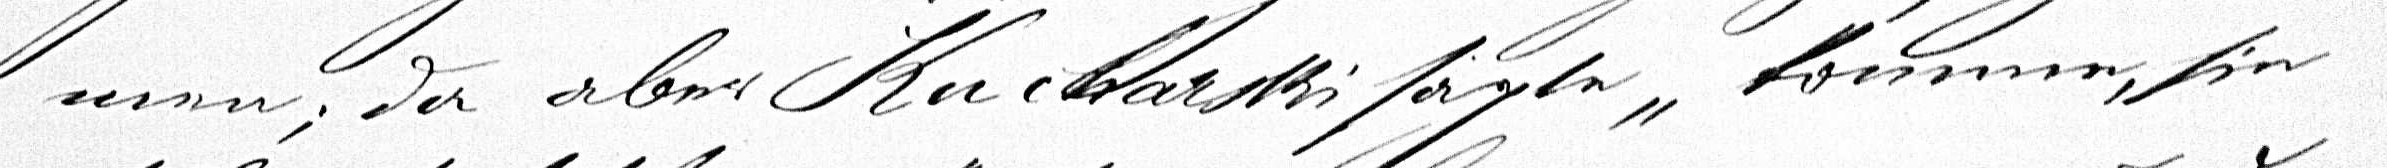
men; da aber Kucharski sagte „Komme, sie
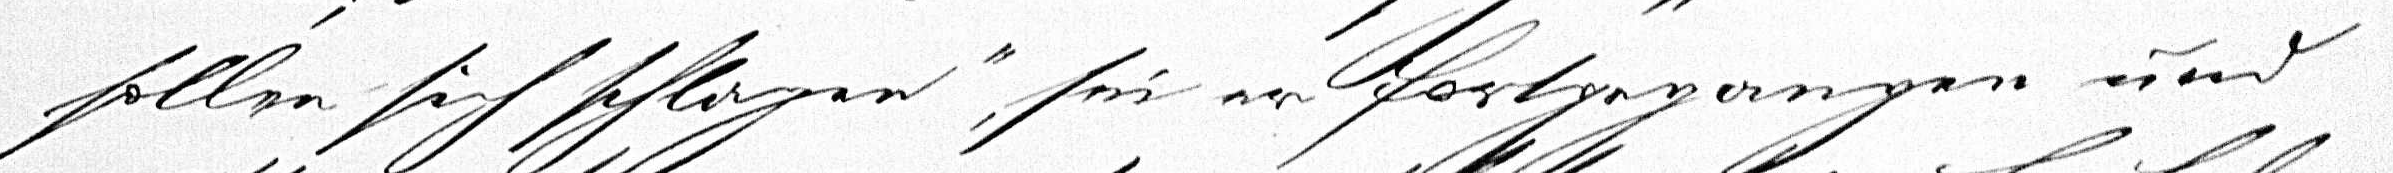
sollen sich schlagen,“ sei er fortgegangen und
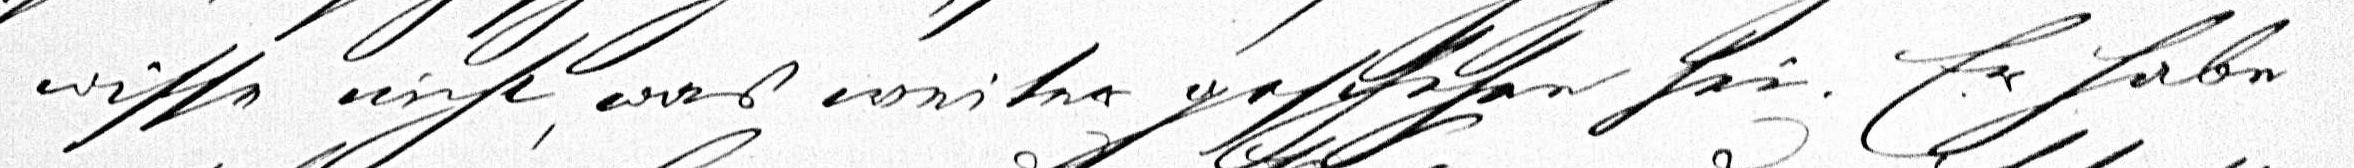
wisse nicht, was weiter geschehen sei. Er habe
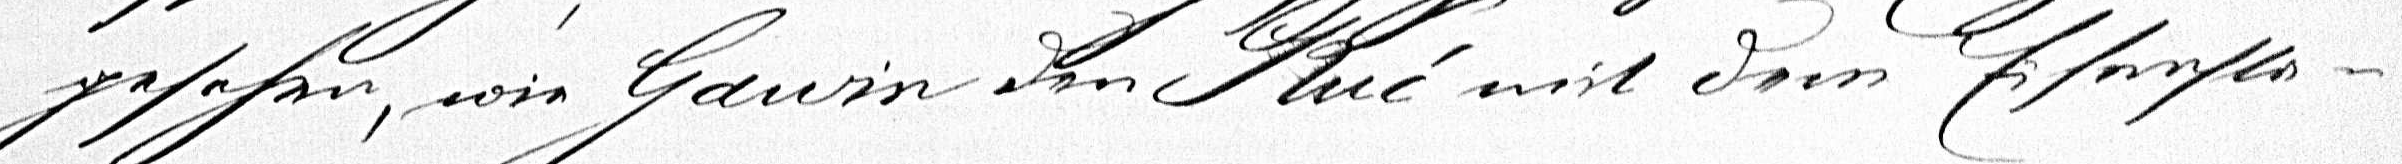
gesehen, wie Gawin den Kuć mit dem Eisensta¬
